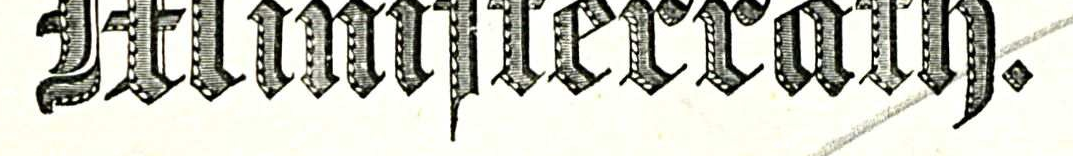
Ministerrath
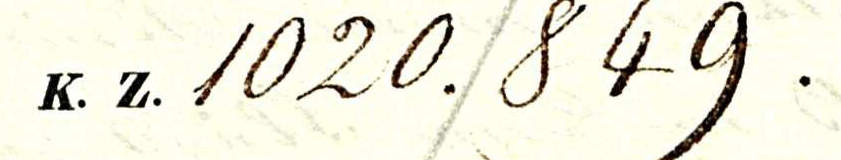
KZ 1020.[1]849
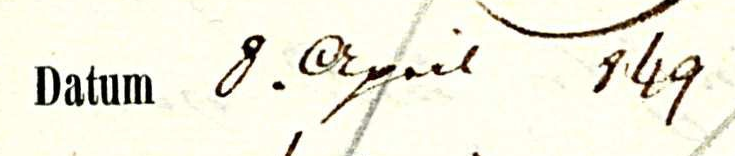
Datum 8. April[1]849
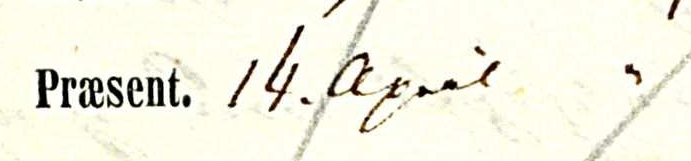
Praesent. 14. April [1]849
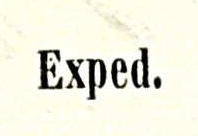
Exped.
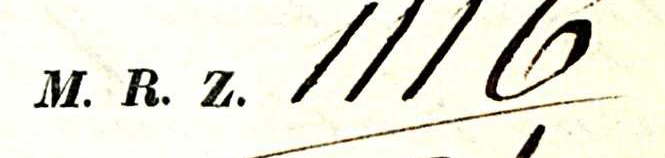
M.R. Z. 1116
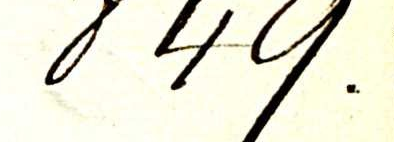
849
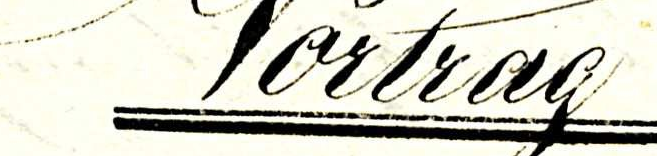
Vortrag
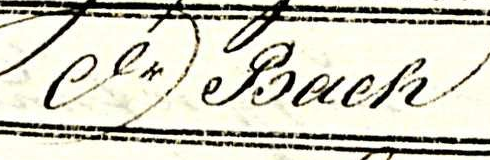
Dr. Bach
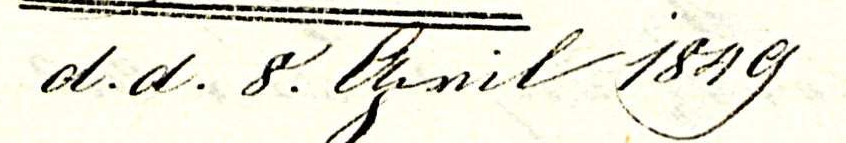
d.d. 8. April 1849
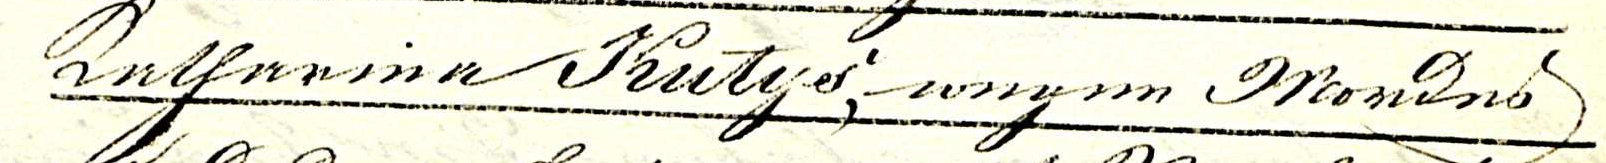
Katharina Kutyś wegen Mordes
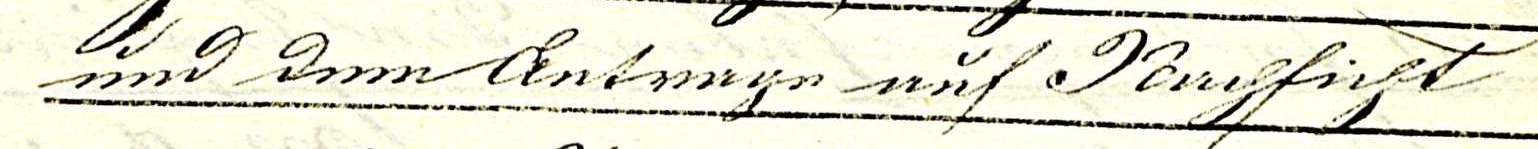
und dem Antrage auf Nachsicht
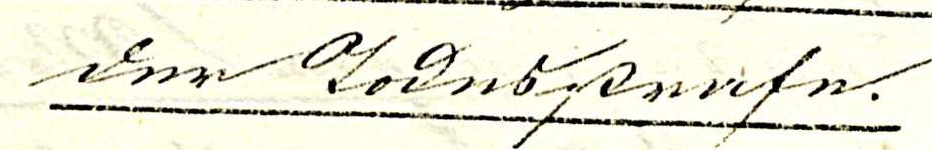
der Todesstrafe.
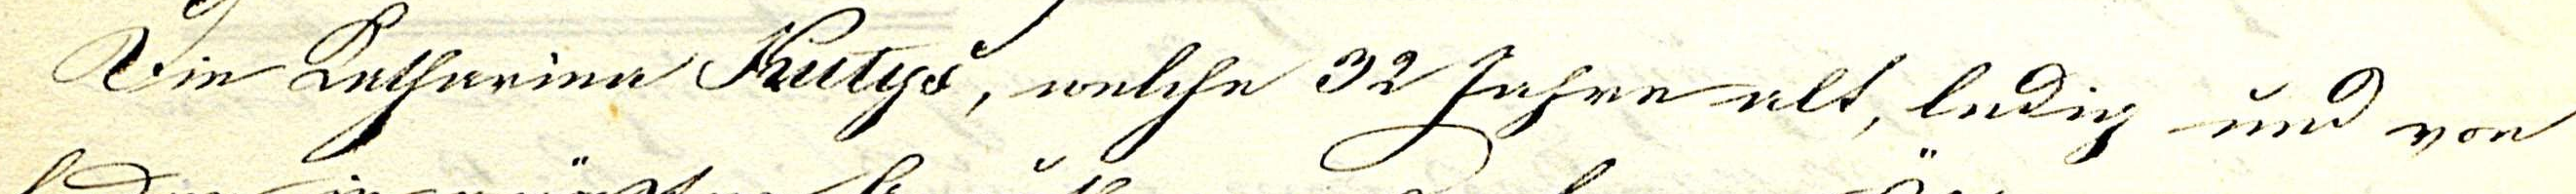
Die Katharina Kutyś, welche 32 Jahre alt, ledig, und von
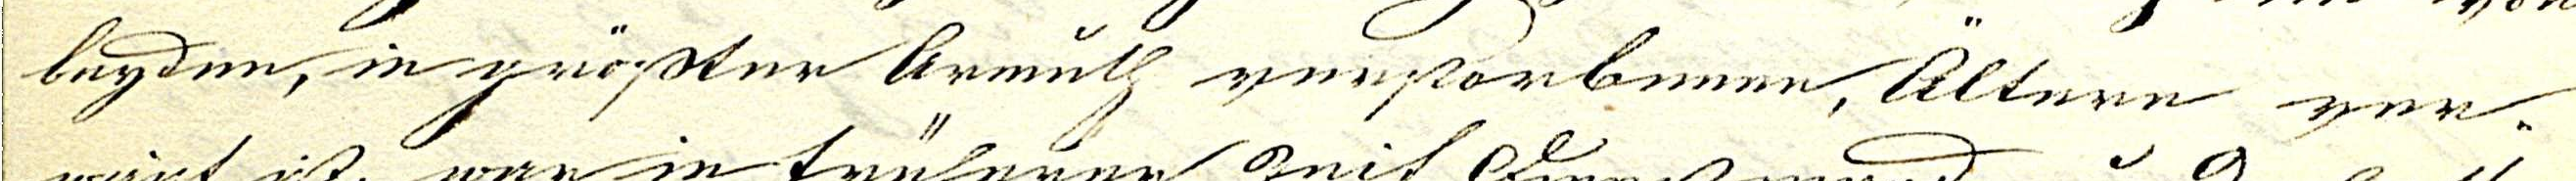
beyden, in größter Armuth verstorbenen, Ältern ver¬
